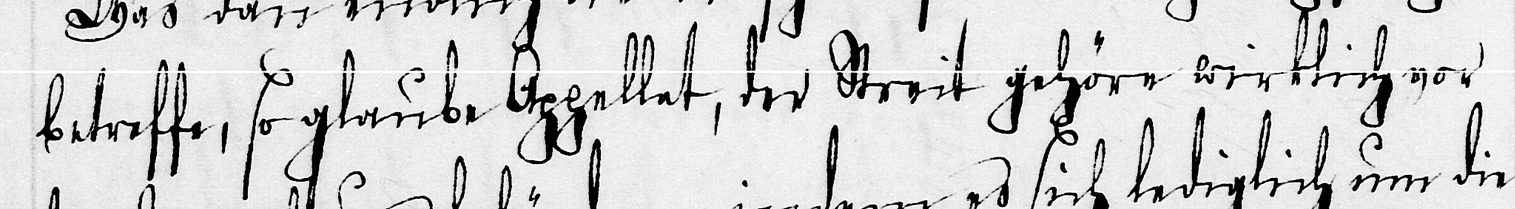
betreffe, so glaube Appellat, der Streit gehöre wirklich vor
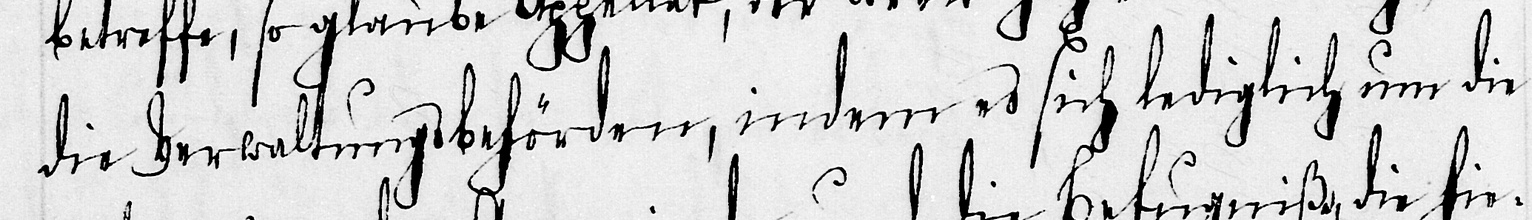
die Verwaltungsbehörden, indem es sich lediglich um die
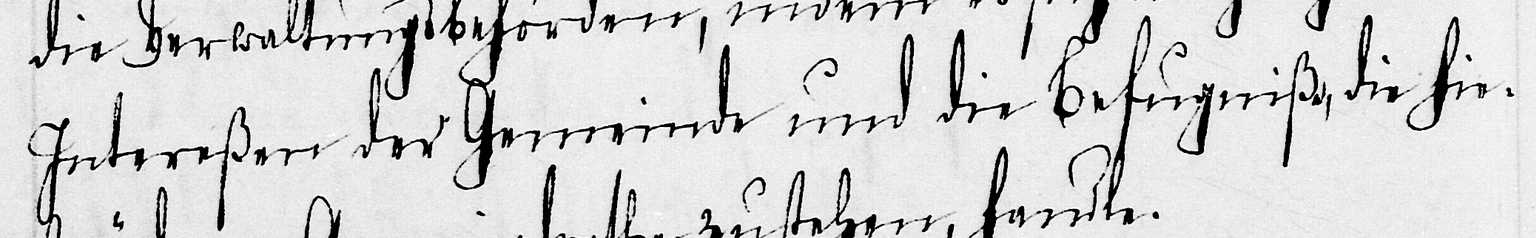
Intereßen der Gemeinde und die Befugniße, die hie¬
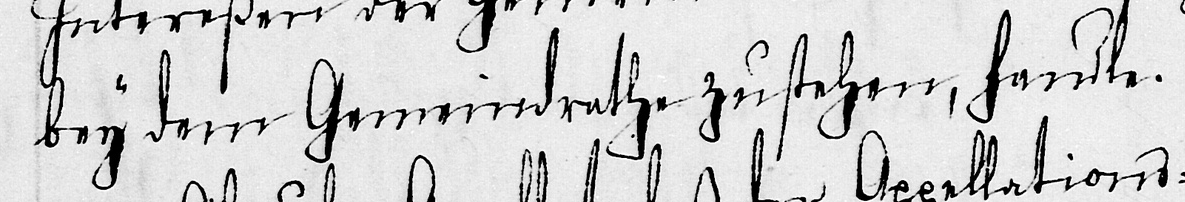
bey dem Gemeindrathe zustehen, handle.
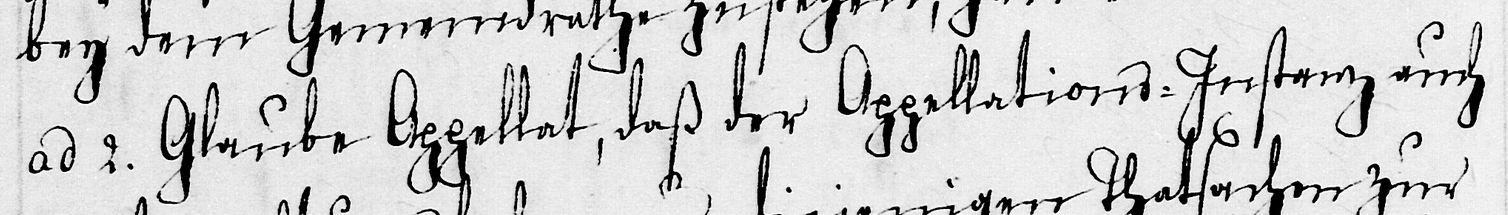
ad 2. Glaube Appellat, daß der Appellations-Instanz auch
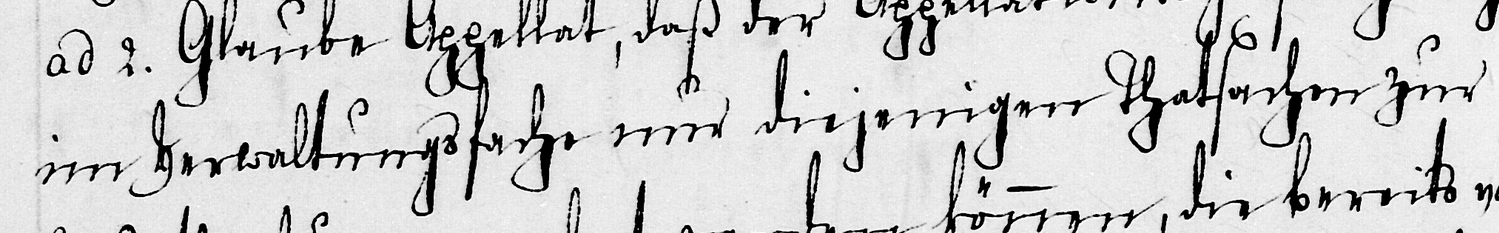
im Verwaltungsfache nur diejenigen Thatsachen zur
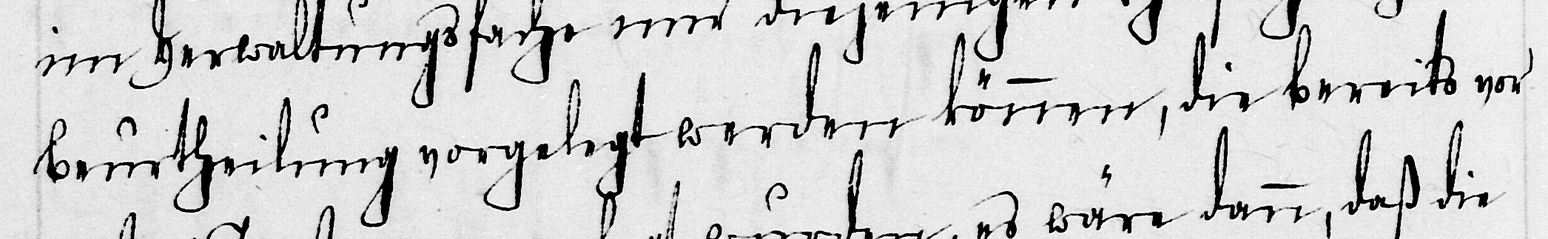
Beurtheilung vorgelegt werden können, die bereits vor
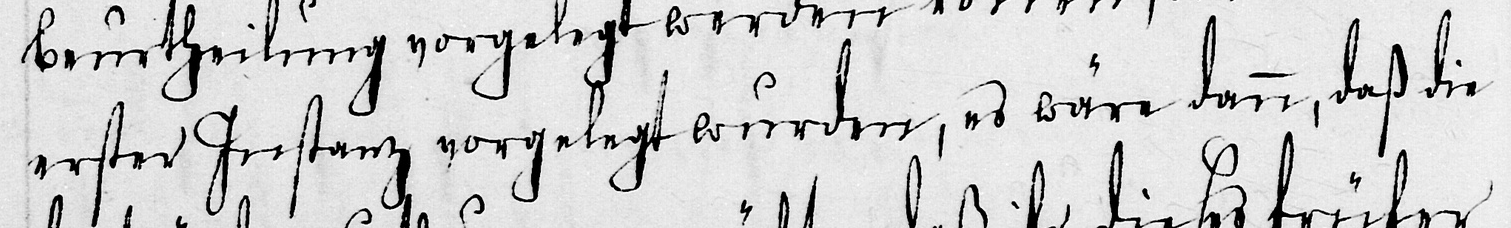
erster Instanz vorgelegt wurden, es wäre dann, daß die
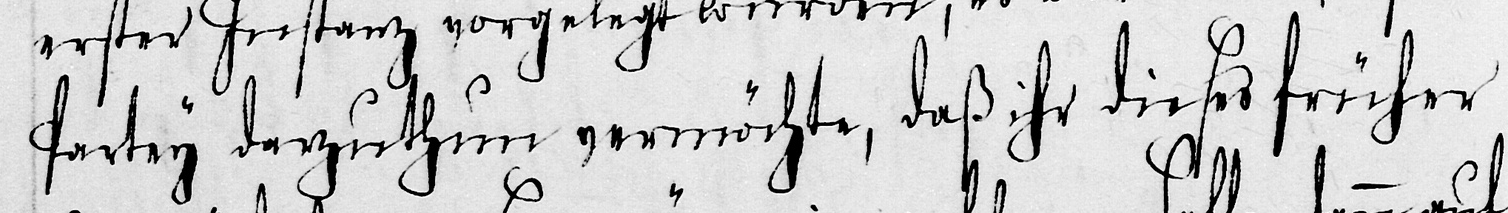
Partey darzuthun vermöchte, daß ihr dieses früher
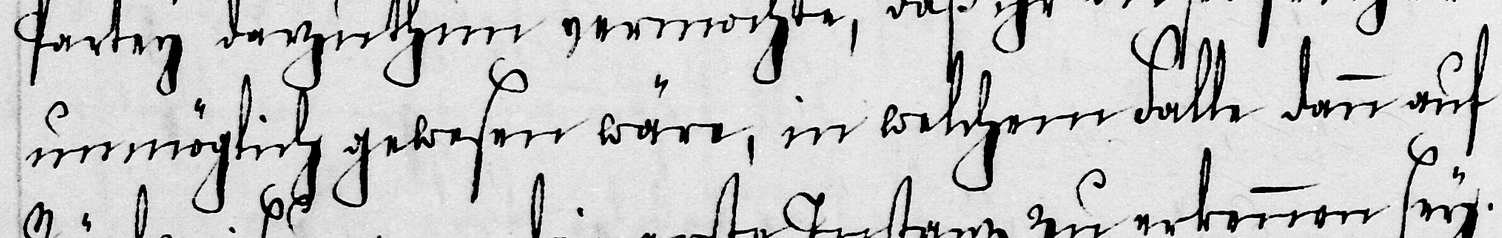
unmöglich gewesen wäre, in welchem Falle dann auf
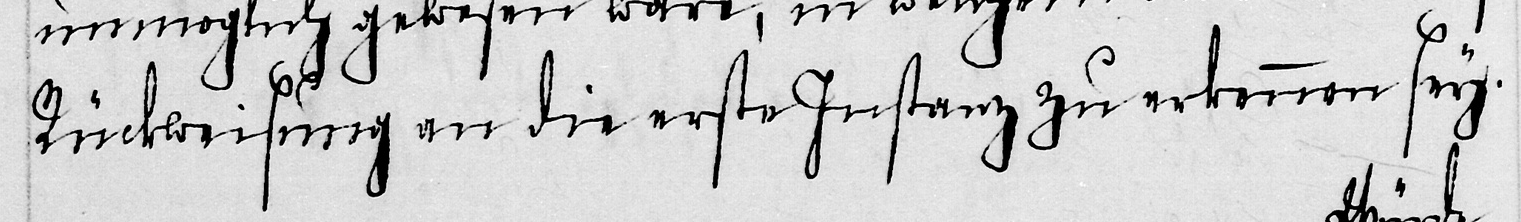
Rückweisung an die erste Instanz zu erkennen sey.
